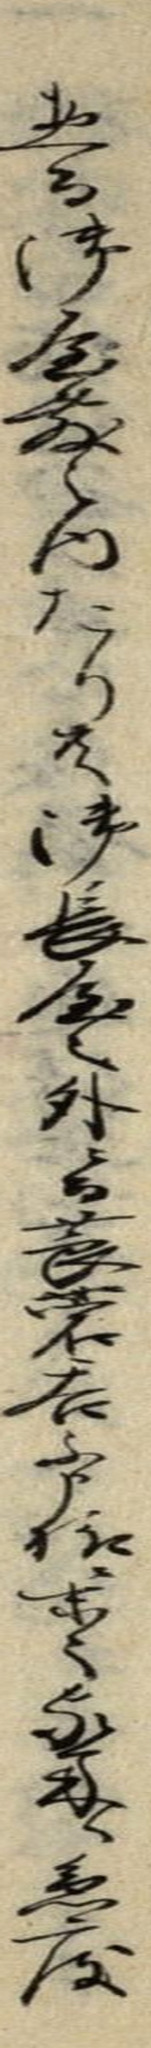惣て御屋敷之内たり共御長屋之外にて莨菪呑不申様に末々家来へ急度
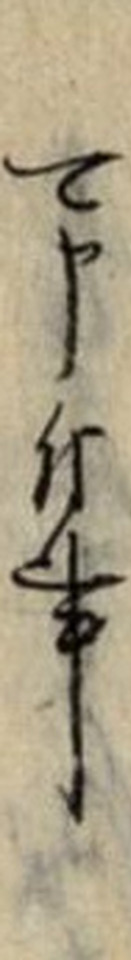可申付事
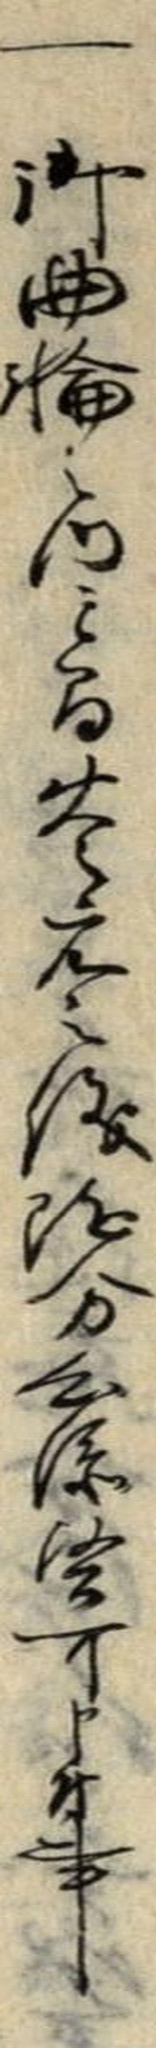一御曲輪之内に候間火之元之儀随分心添堅可申付事
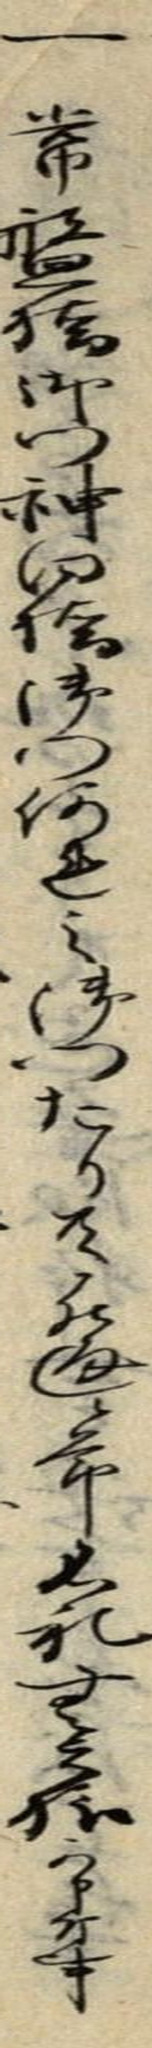一常盤橋御門神田橋御門何れ之御門たり共罷通候節不礼無之様可申付事
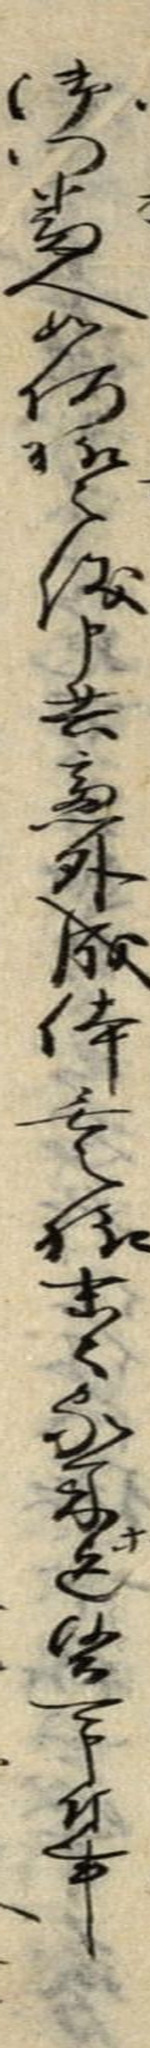御門番人如何様之儀申共慮外なる体無之様末々家来等迄堅可申付事
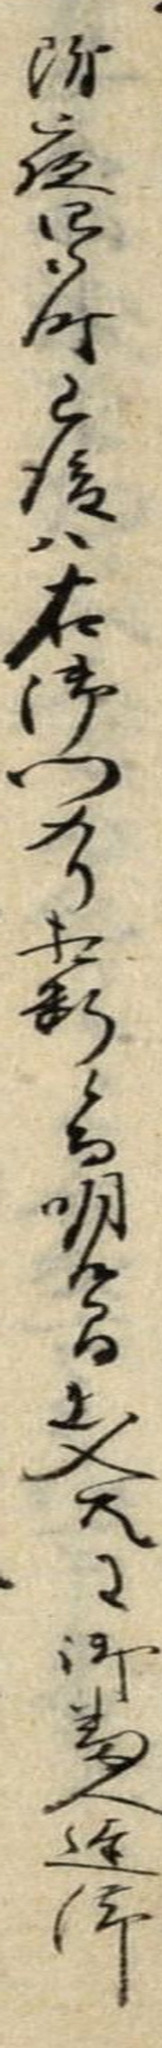附夜四ツ時已後は右御門〆り相断候て明候間出入共に御番人遅滞
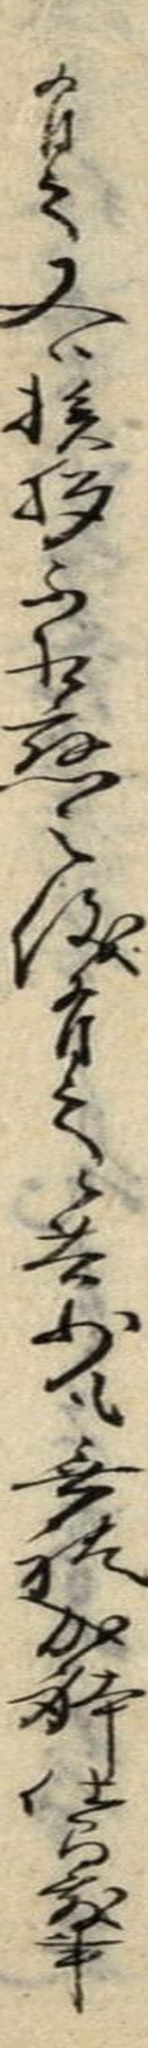有之又は挨拶不相応之儀有之候共少も無礼成体仕間敷事
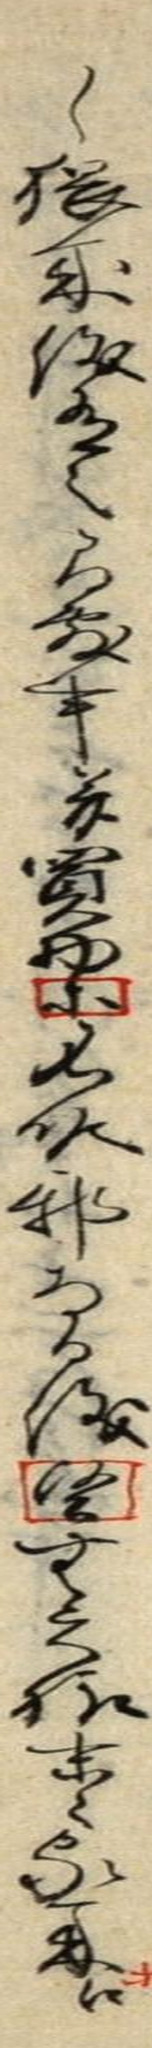し猥成儀有之間敷事幷買物等不順邪なる儀堅無之様末々家来等江
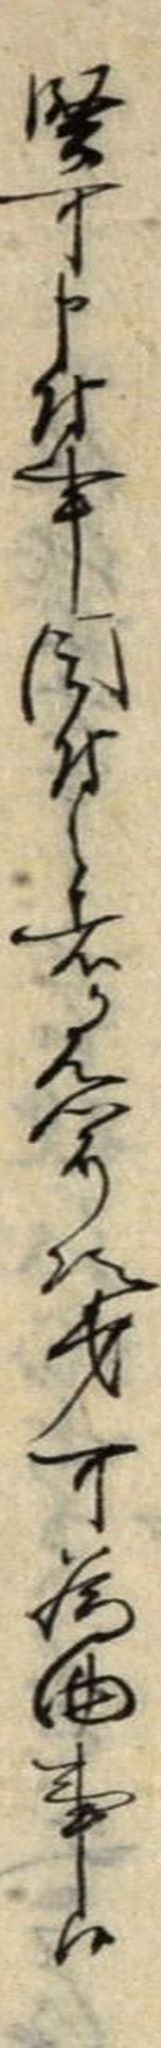堅可申付事目付之者見聞次第可為曲事候

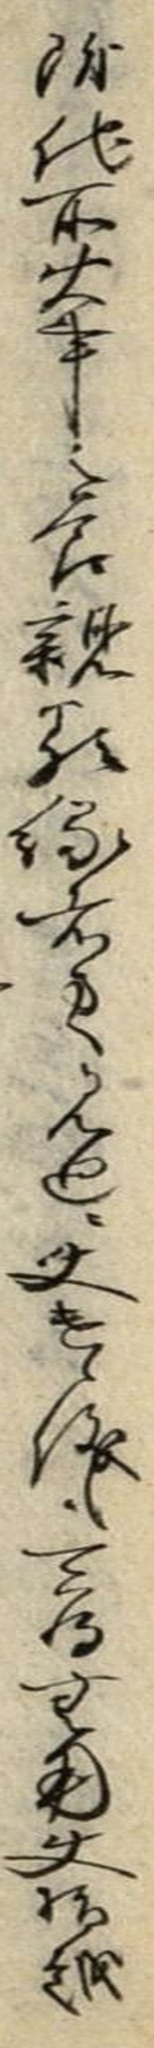附他所火事之節親類縁者ゆへ見廻に使遣候儀も可為無用使指越
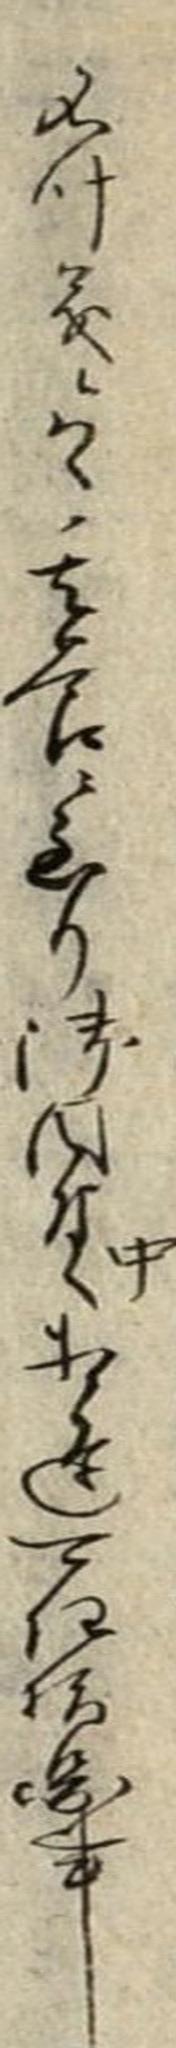不叶義候はゝ其節に至り御目付中へ相達可任指図事
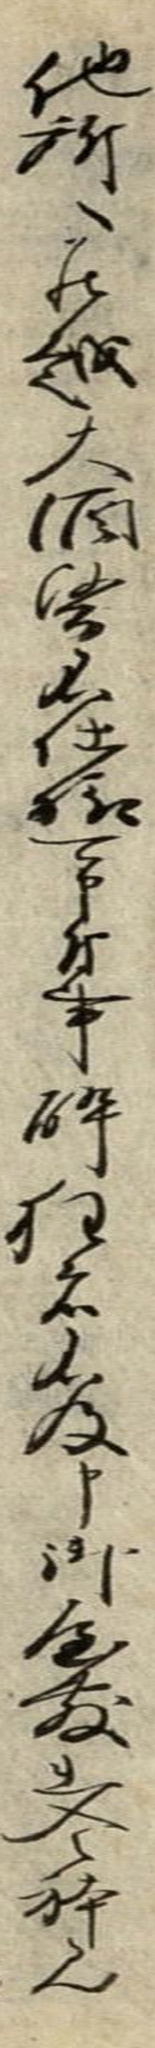一他所へ罷越大酒堅不仕様可申付事酔狂は不及申御屋敷出入之体見
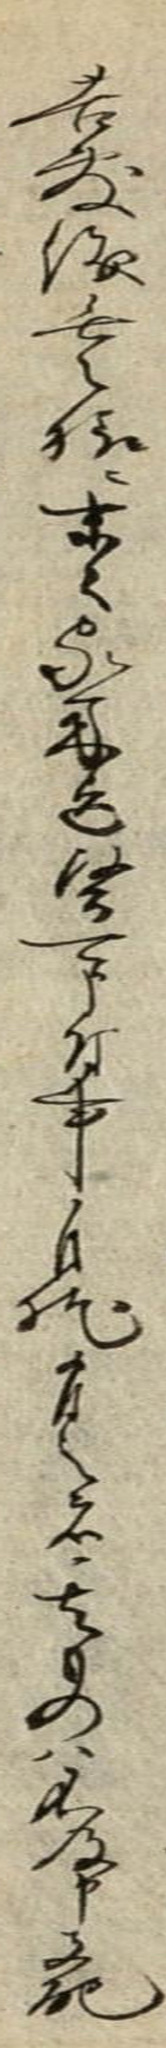苦敷儀無之様に末々家来迄堅可申付事自然有之は其ものは不及申支配
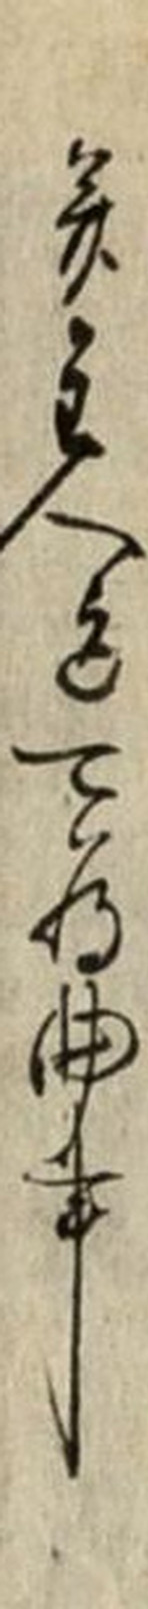幷主人迄可為曲事
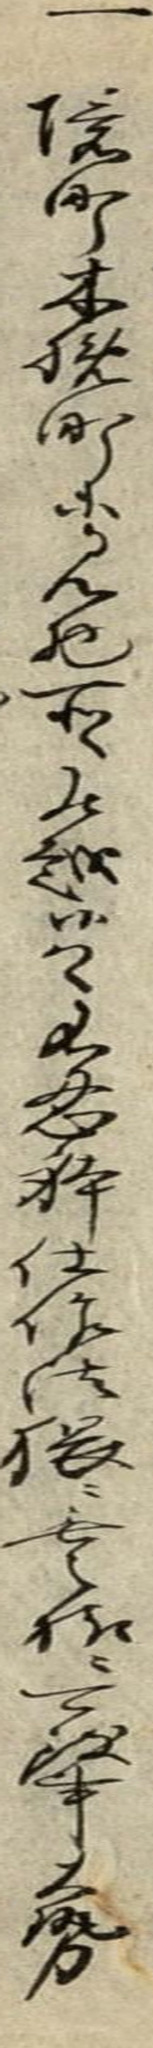一境町木挽町等見物所々罷越候はゝ不忍体仕作法猥に無之様可致事大勢
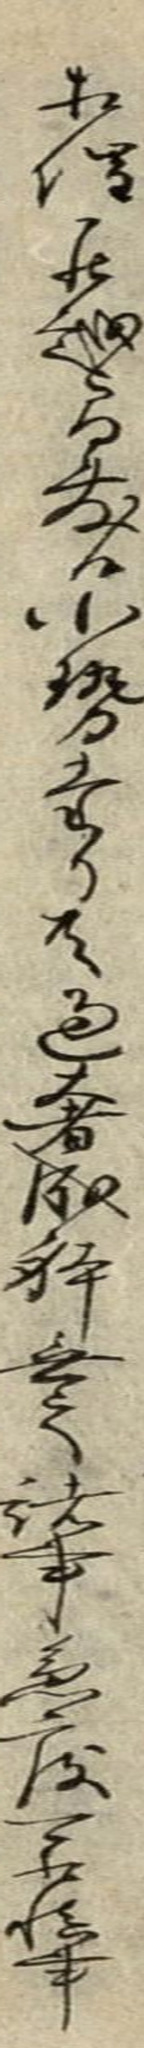相催罷越間敷候小勢たり共過奢成体無之諸事急度可相慎事
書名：三都并道中之部
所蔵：福井県文書館 Fukui Prefectural Archives
